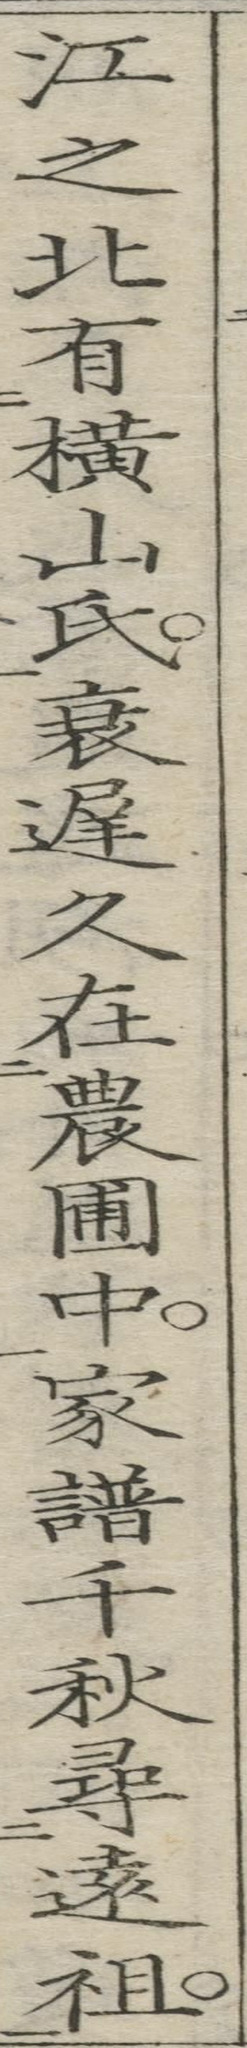江之北有横山氏衰遅久在農圃中家譜千秋尋遠祖
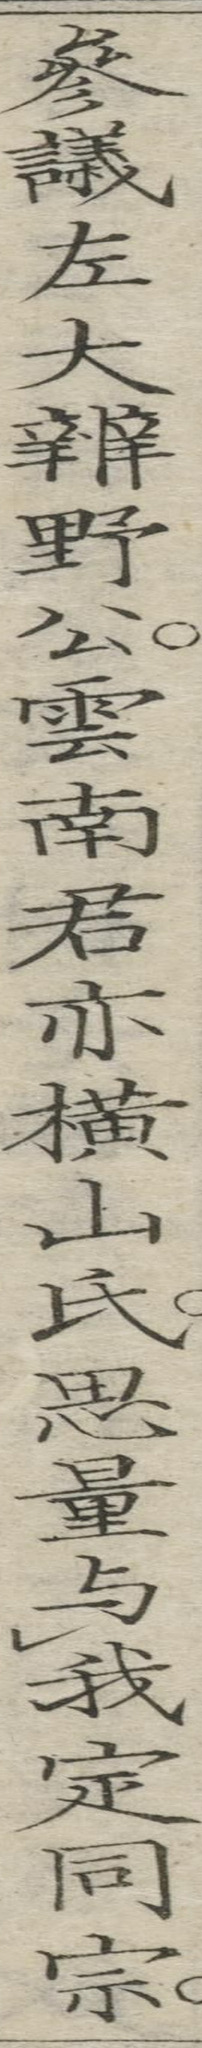参議左大辨野公雲南君亦横山氏思量与我定同宗
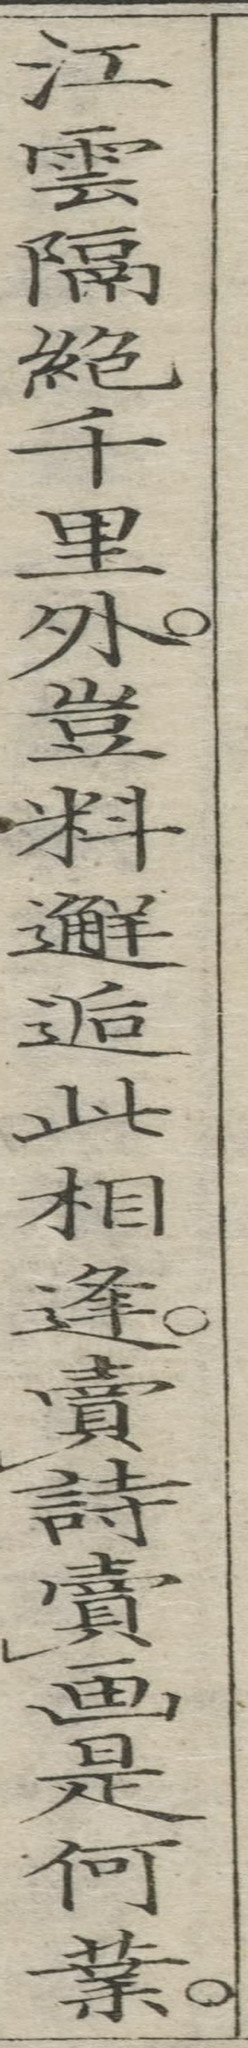江雲隔絶千里外豈料邂逅此相逢売詩売画是何業
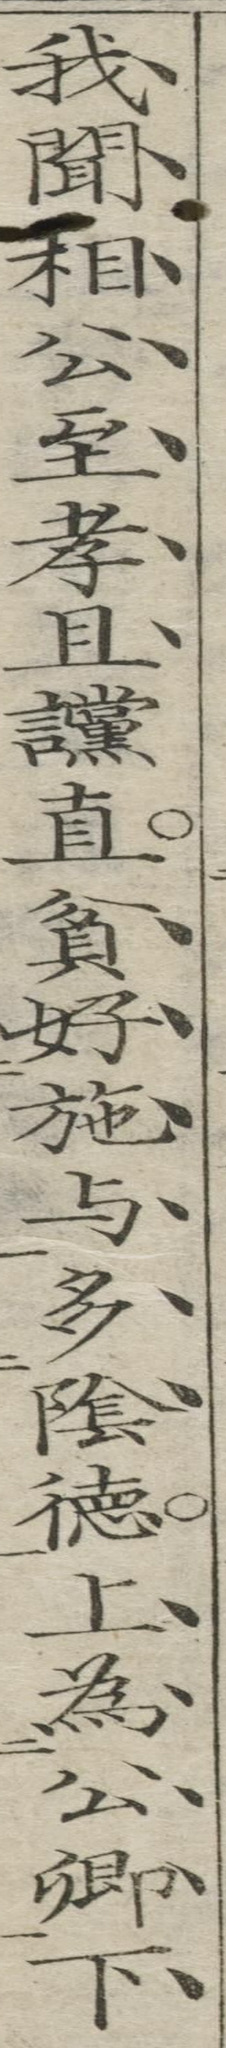我聞相公至孝且讜直貧好施与多陰徳上為公卿下
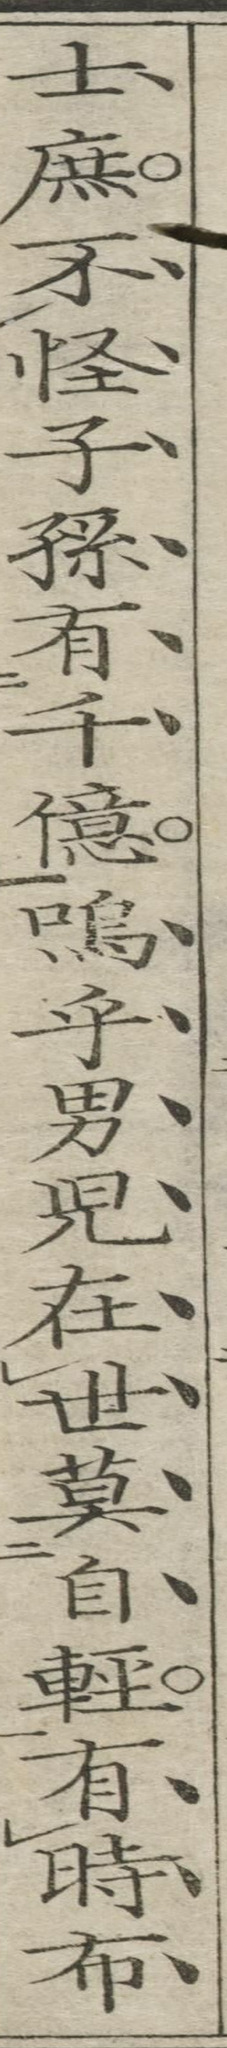士庶不怪子孫有千億」嗚呼男児在世莫自軽有時布
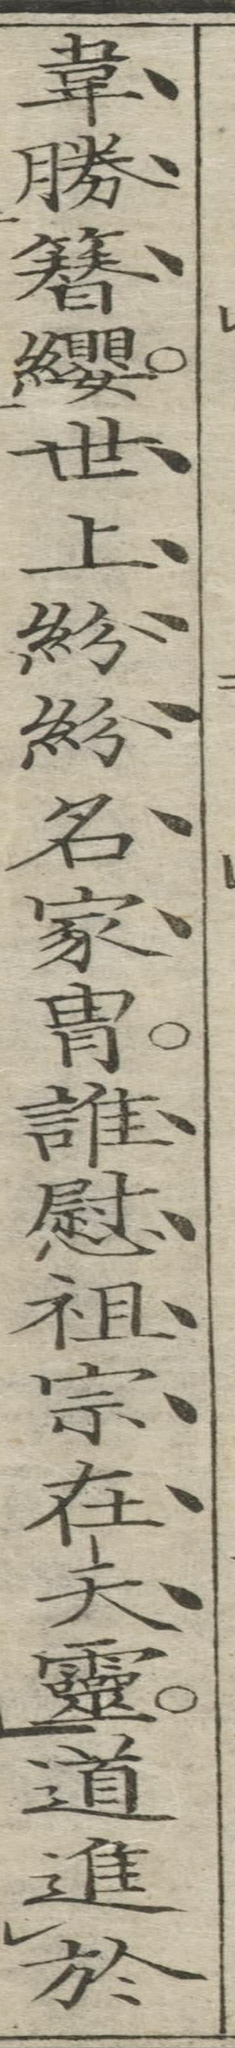韋勝簪纓世上紛紛名家冑誰慰祖宗在-天霊」道進於

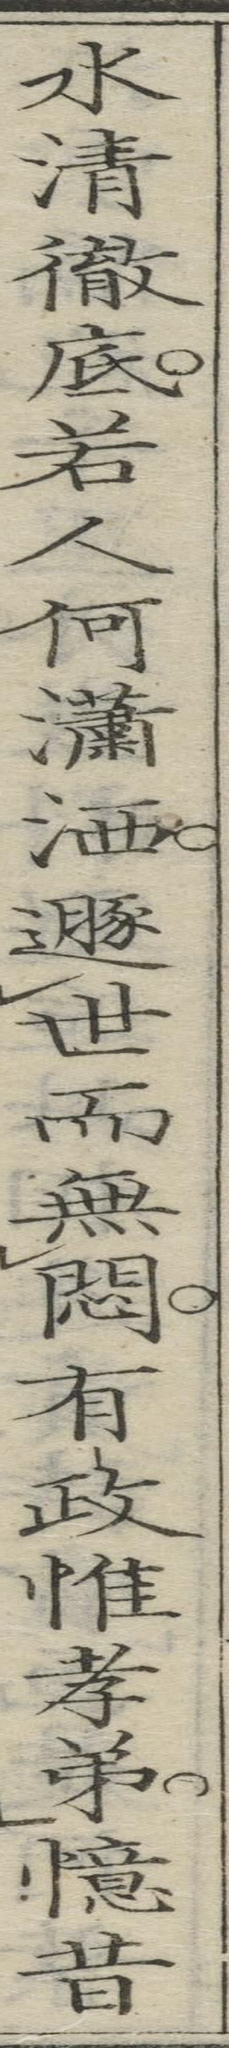水清徹底若人何瀟洒遯世而無悶有-政惟孝弟」憶昔
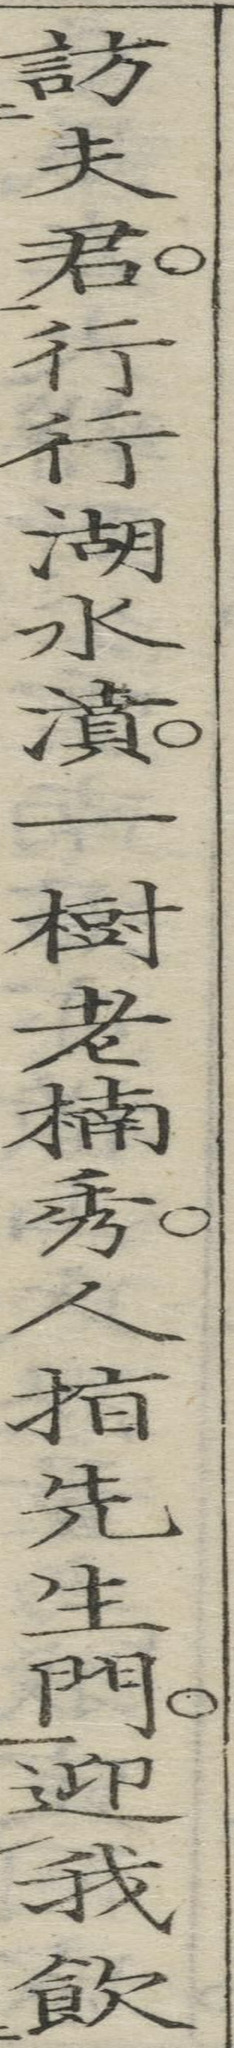訪夫君行行湖水濆一樹老楠秀人指先生門」迎我飲
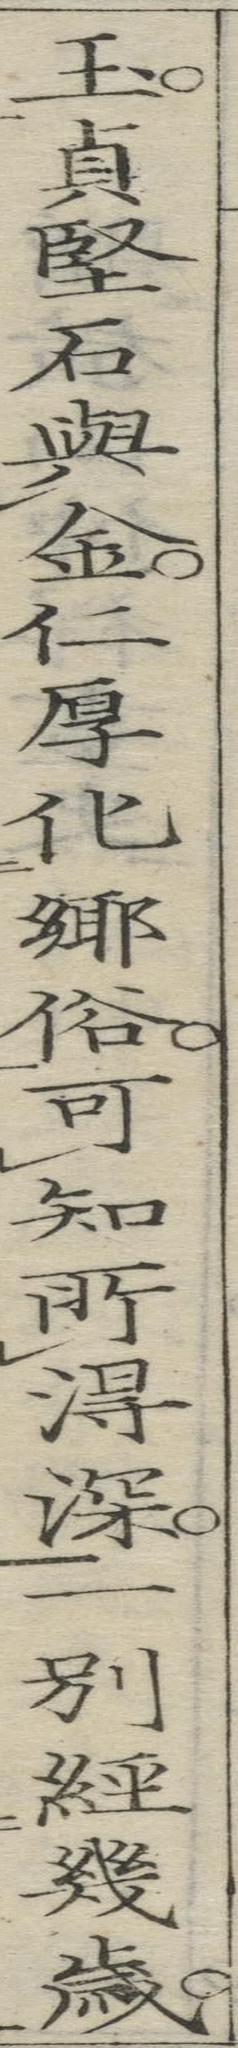玉貞堅石與金仁厚化郷俗可知所得深」一別経幾歳
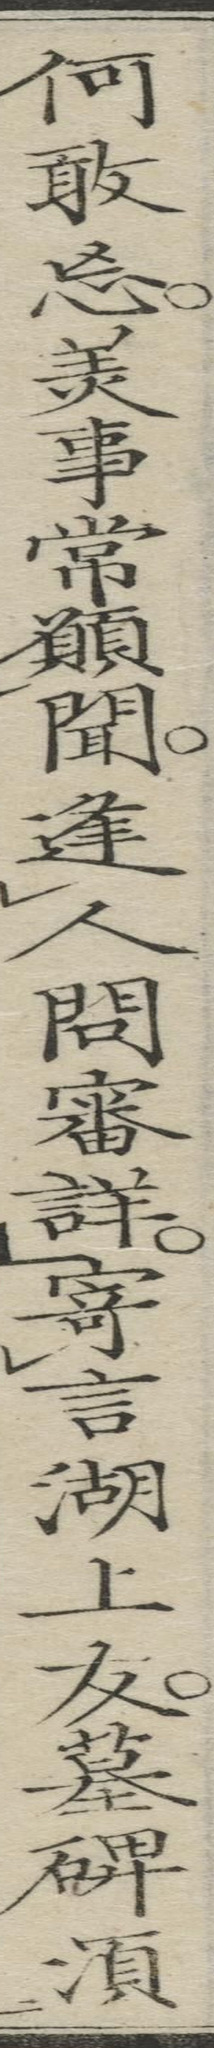何敢忘美事常願聞逢人問審詳」寄言湖上友墓碑須
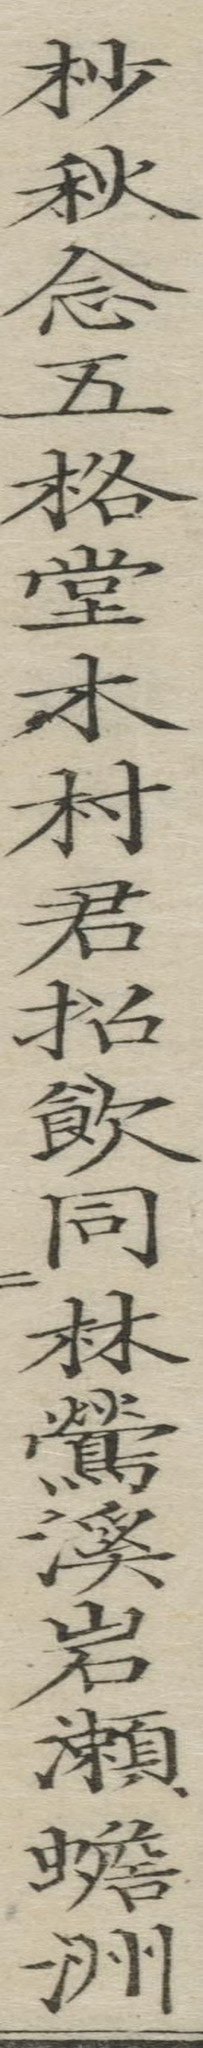杪秋念五格堂木村君招飲同林鶯溪岩瀬蟾州
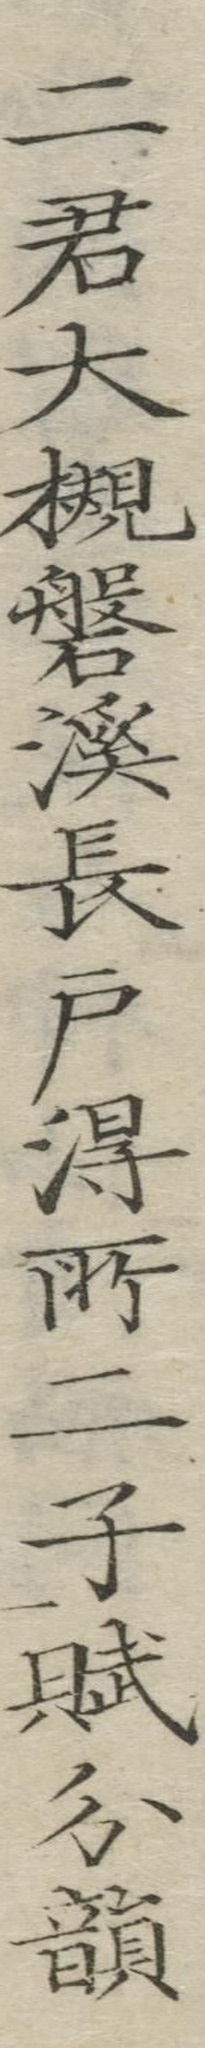二君大槻磐溪長戸得所二子賦分韻
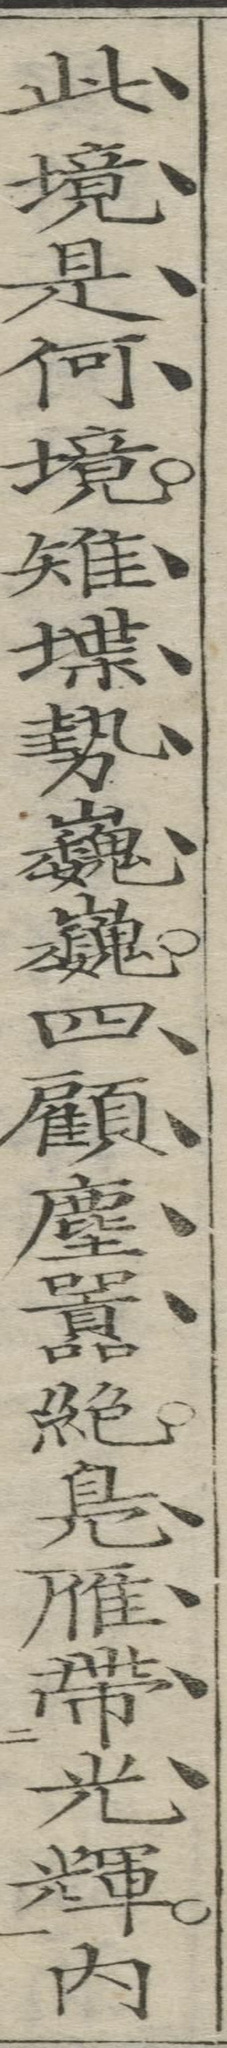此境是何境雉楪勢巍巍四顧塵囂絶鳬雁帯光輝内
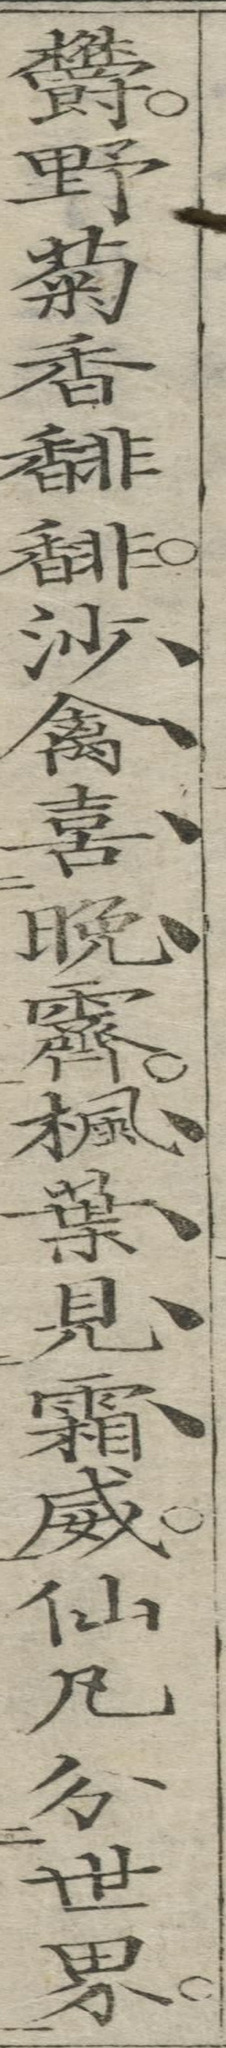欝野菊香馡馡沙禽喜晩霽楓葉見霜威仙凡分世界

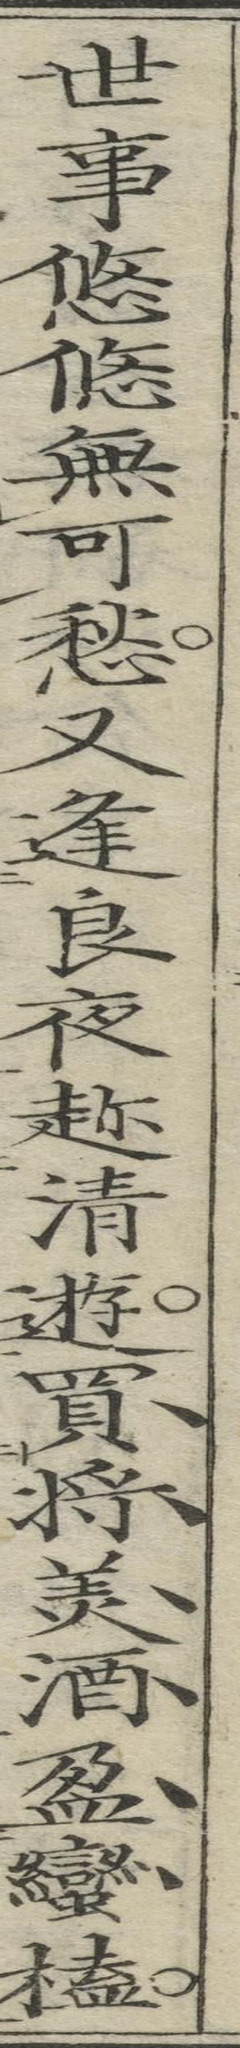世事悠悠無可愁又逢良夜趂清遊買-将美酒盈蛮榼
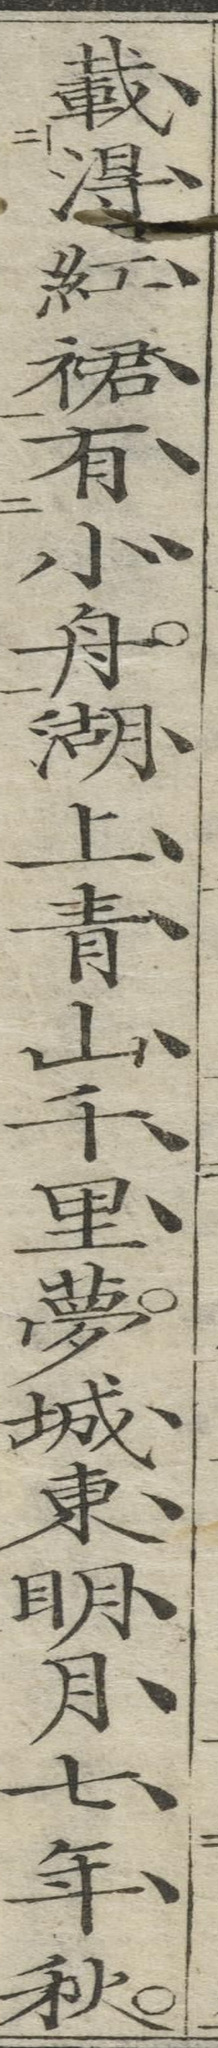載-得紅裙有小舟湖上青山千里夢城東明月七年秋
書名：火後憶得詩
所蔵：東京大学地震研究所図書室 Earthquake Research Institute Library, The University of Tokyo, JAPAN
